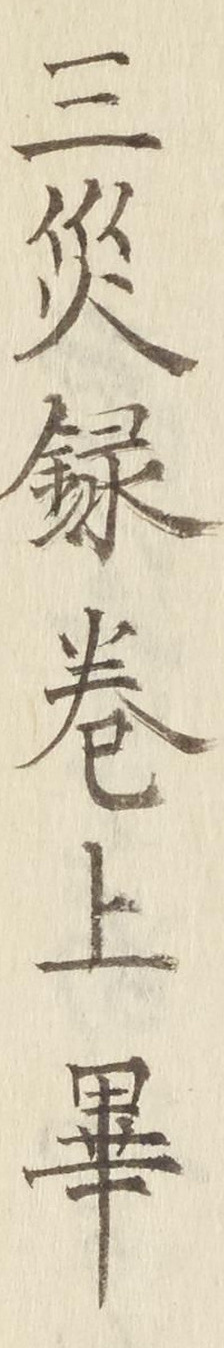三災録巻上畢
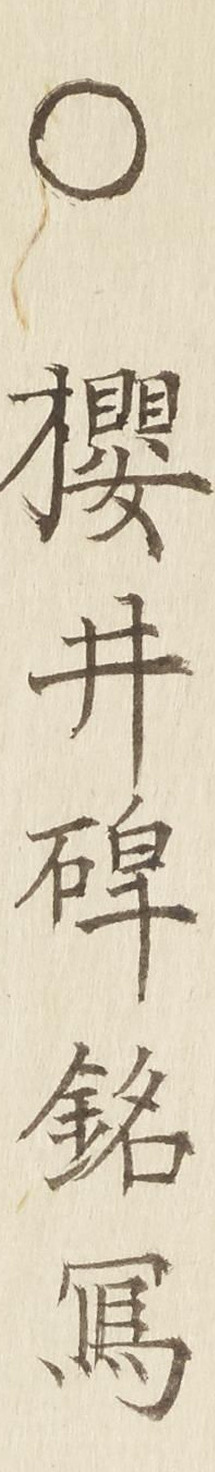〇桜井碑銘写
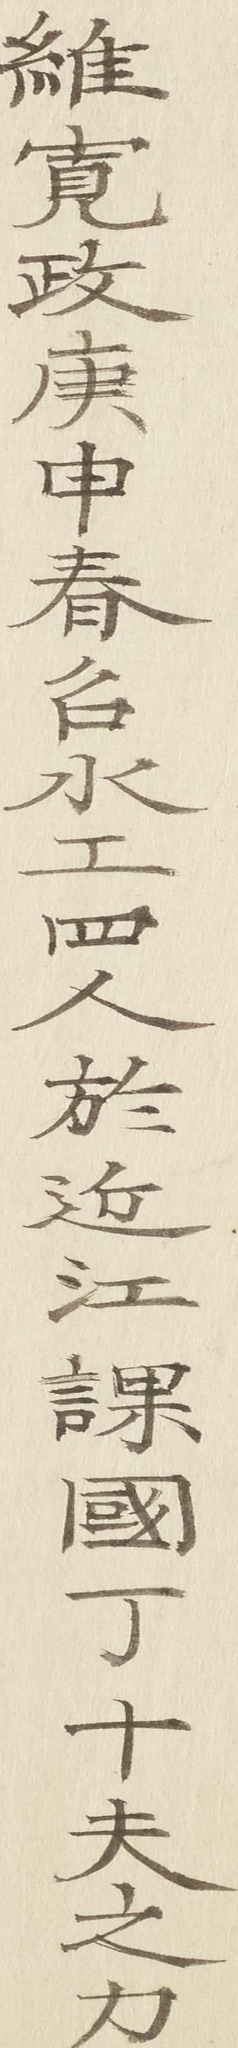維寛政庚申春召水工四人於近江課国丁十夫之力
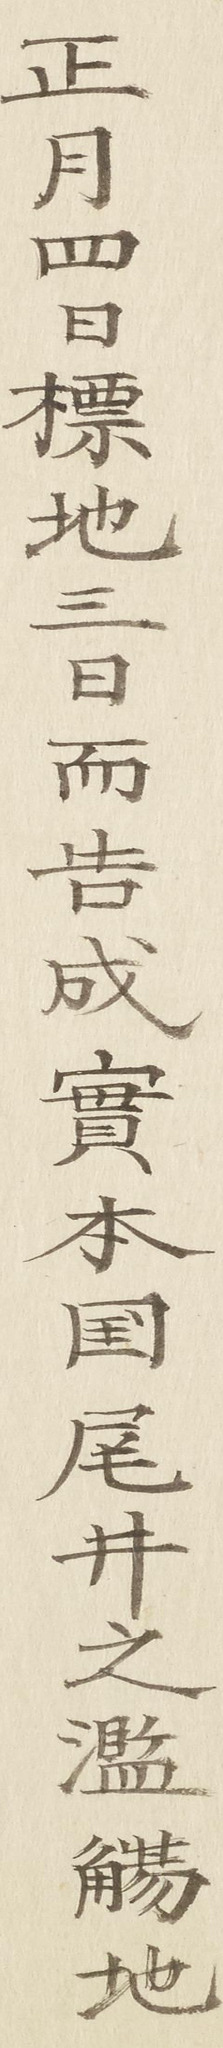正月四日標地三日而告成実本国尾井之濫觴地
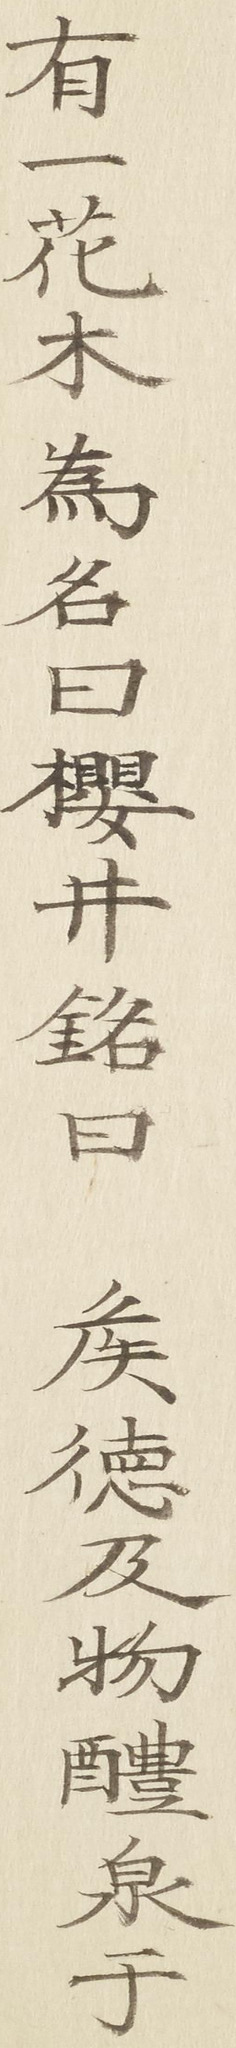有一花木為名曰桜井銘曰矦徳及物醴泉于
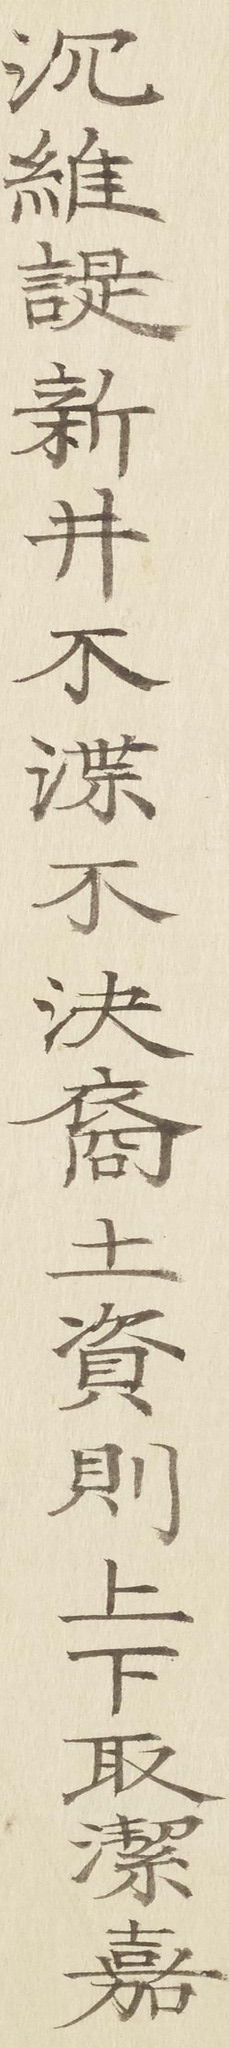沈維諟新井不渫不決裔土資則上下取潔嘉
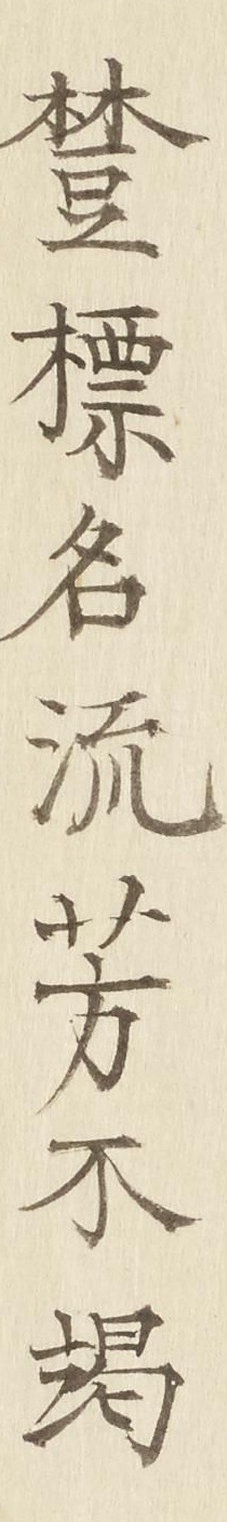登標名流芳不竭

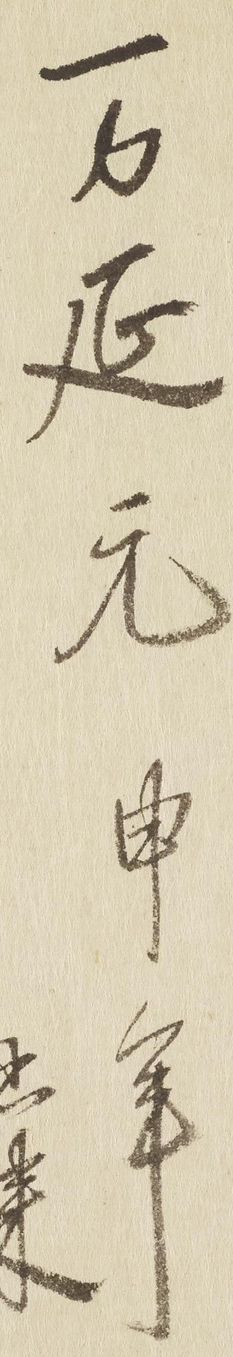万延元申年
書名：地震記　上
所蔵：東京大学地震研究所図書室 Earthquake Research Institute Library, The University of Tokyo, JAPAN
